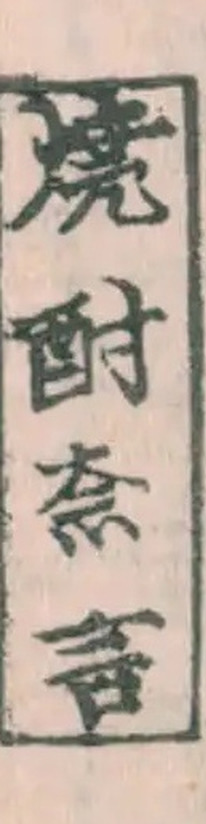焼酎奈言
